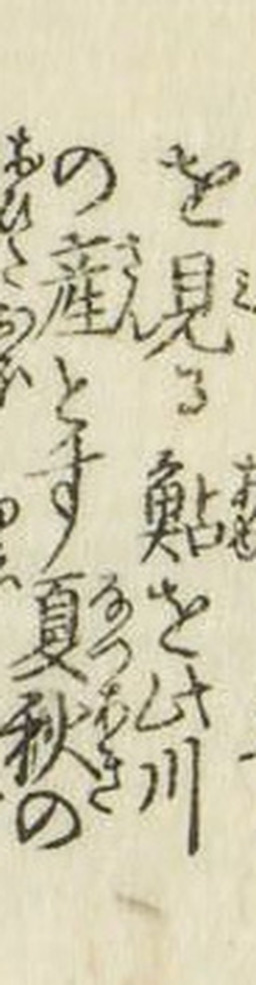の産とす夏秋の
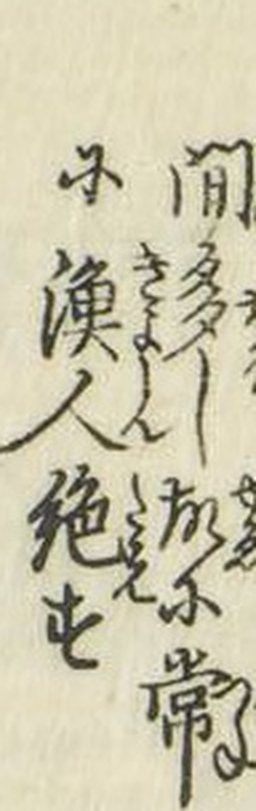に漁人絶す

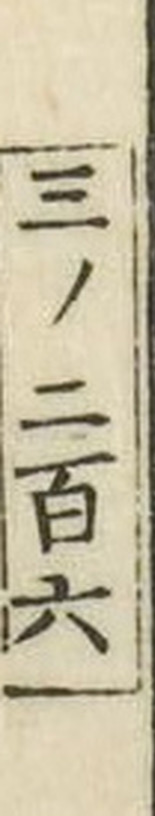三ノ二百六
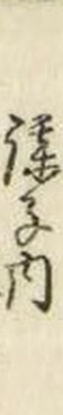禖子内
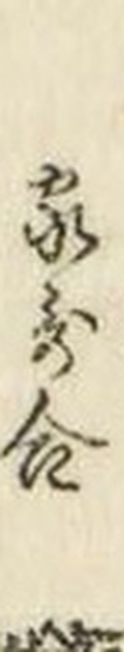家哥合
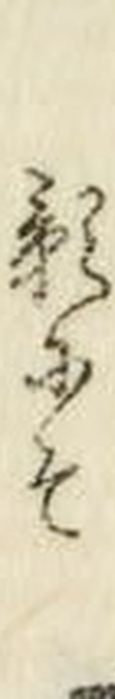影にそ
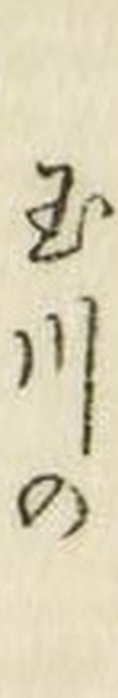玉川の
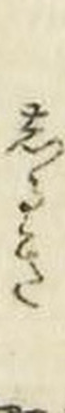しるき
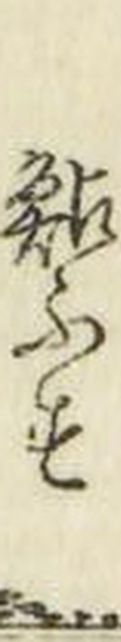鮎ふす

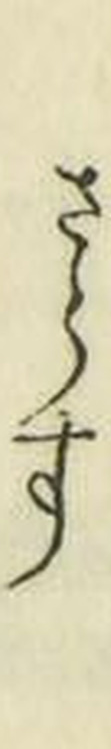さらす
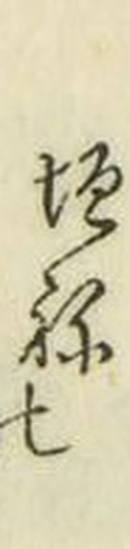垣ねの
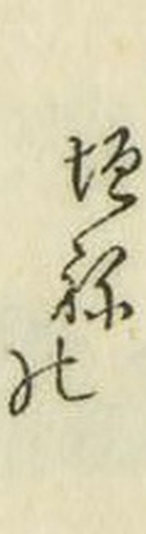垣ねの
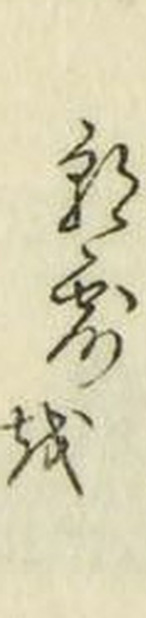朝露を
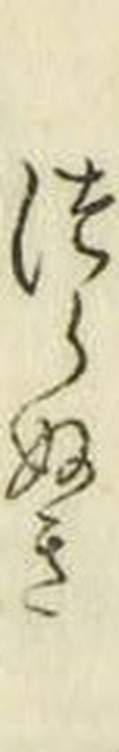つらぬき
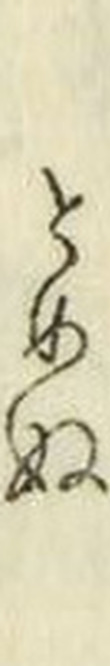とめぬ
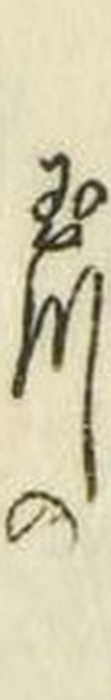玉川の
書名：江戸名所図会 20巻 巻之10
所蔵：東京学芸大学教育コンテンツアーカイブ
